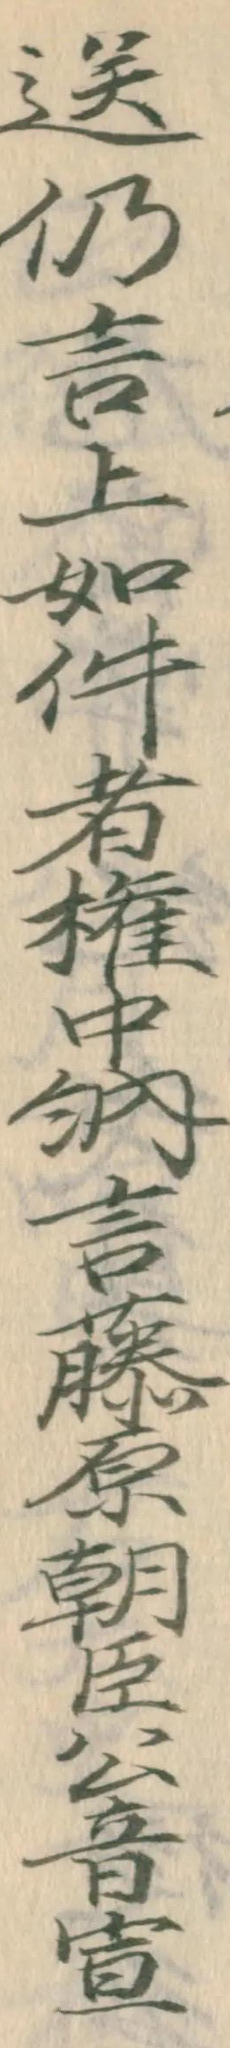送仍言上如件者権中納言藤原朝臣公音宣
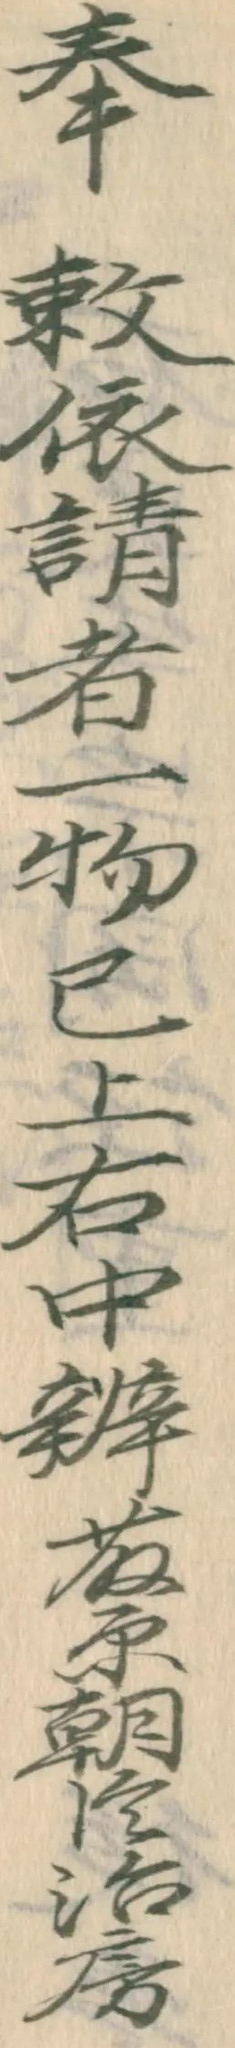奉勅依請者一物已上右中弁藤原朝臣治房
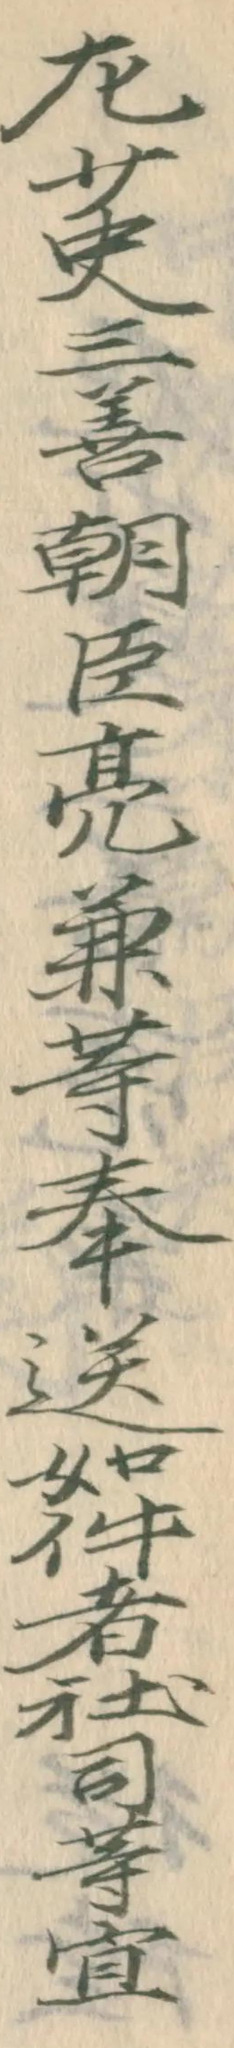左少史三善朝臣亮兼等奉送如件者社司等宜
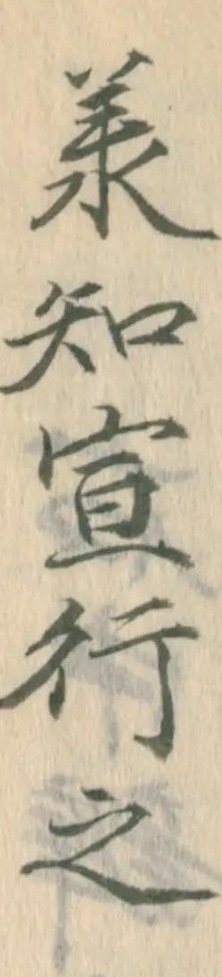承知宣行之
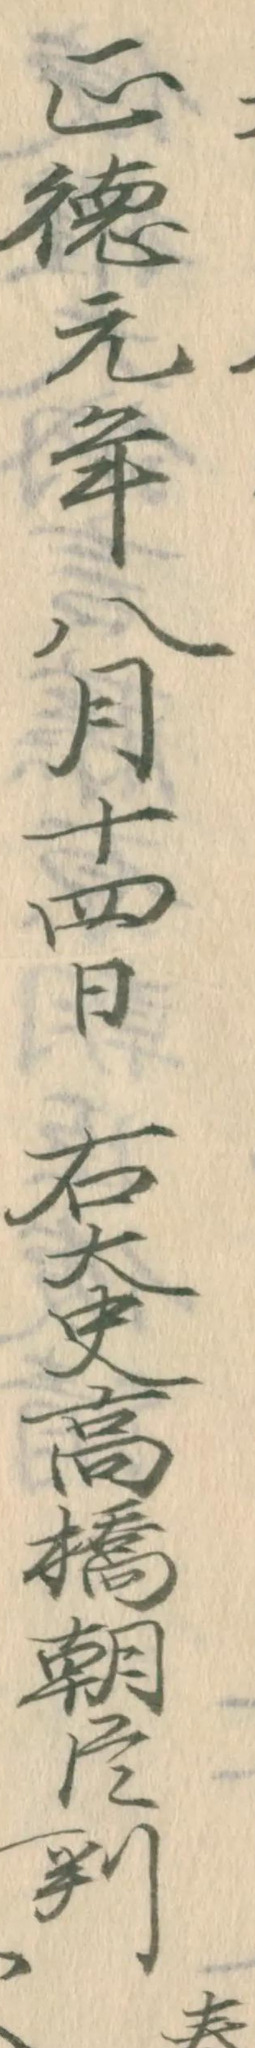正徳元年八月十四日右大史高橋朝臣判奉
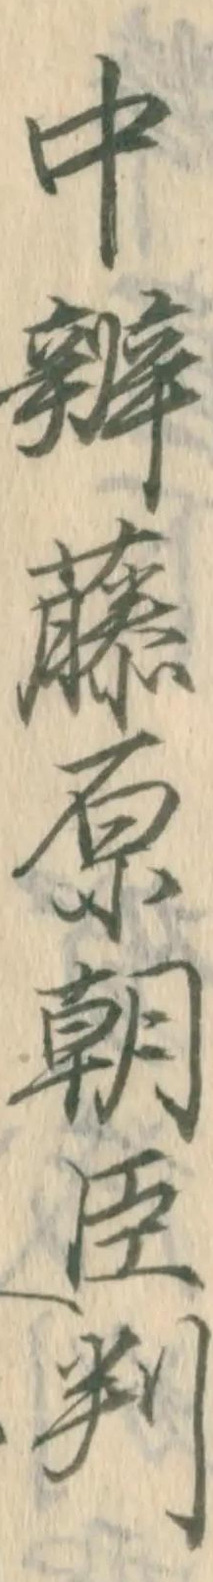中弁藤原朝臣判

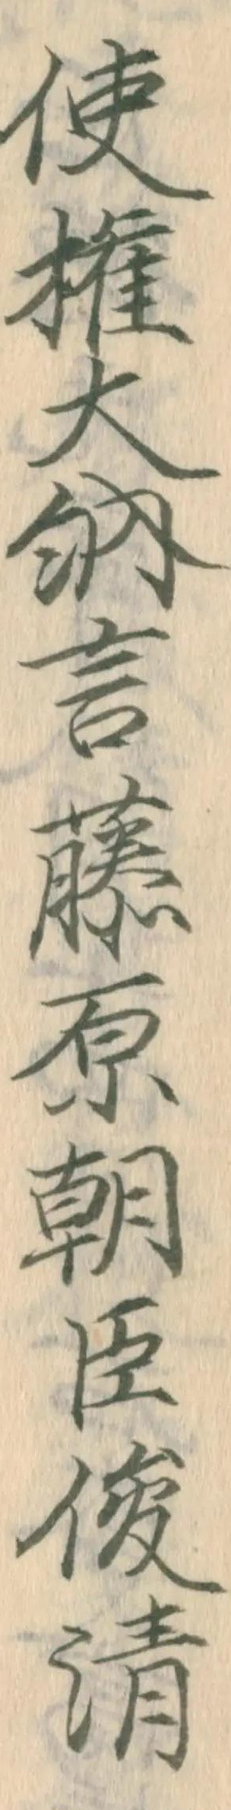使権大納言藤原朝臣俊清
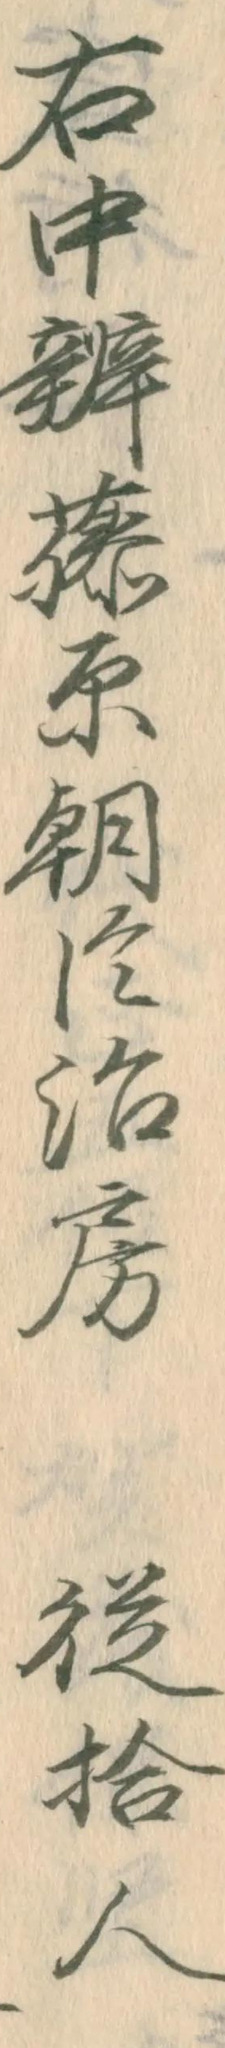右中弁藤原朝臣治房従拾人
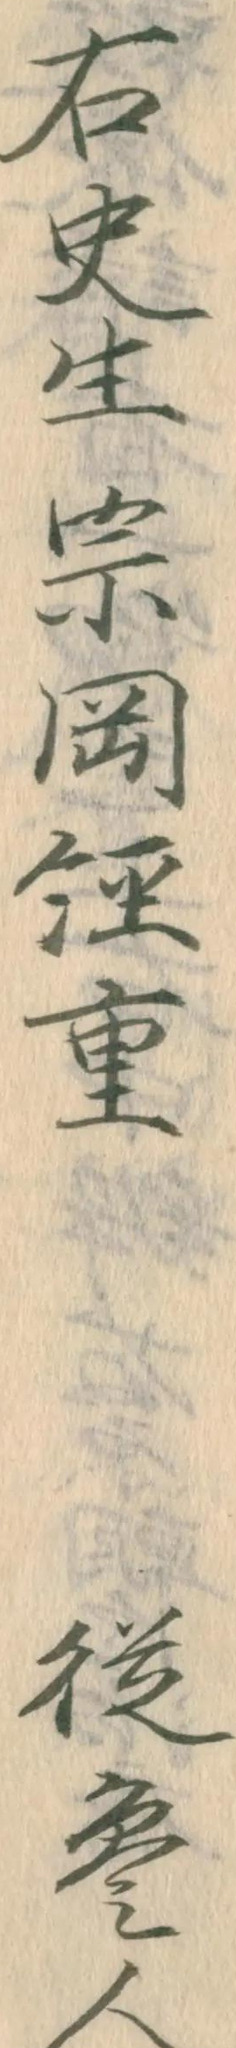右史生宗岡経重従参人
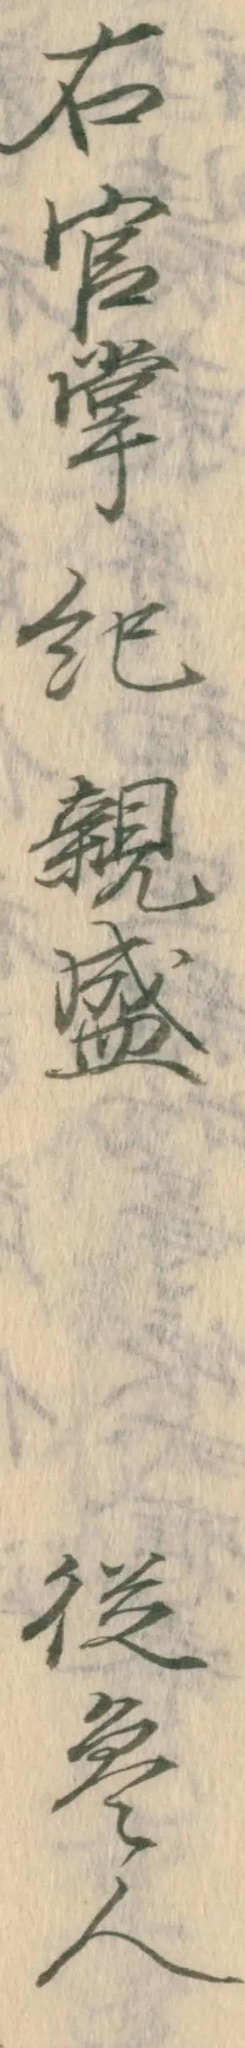右官掌記親盛従参人
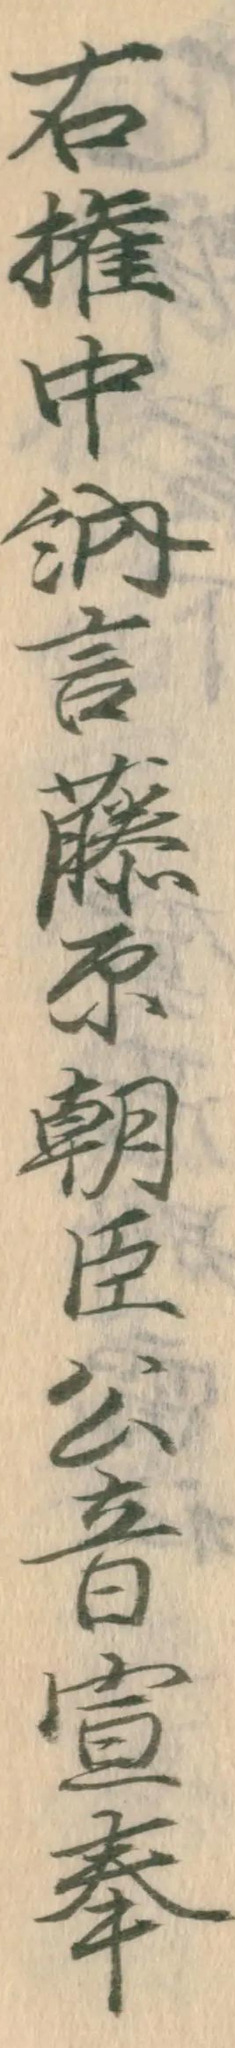右権中納言藤原朝臣公音宣奉
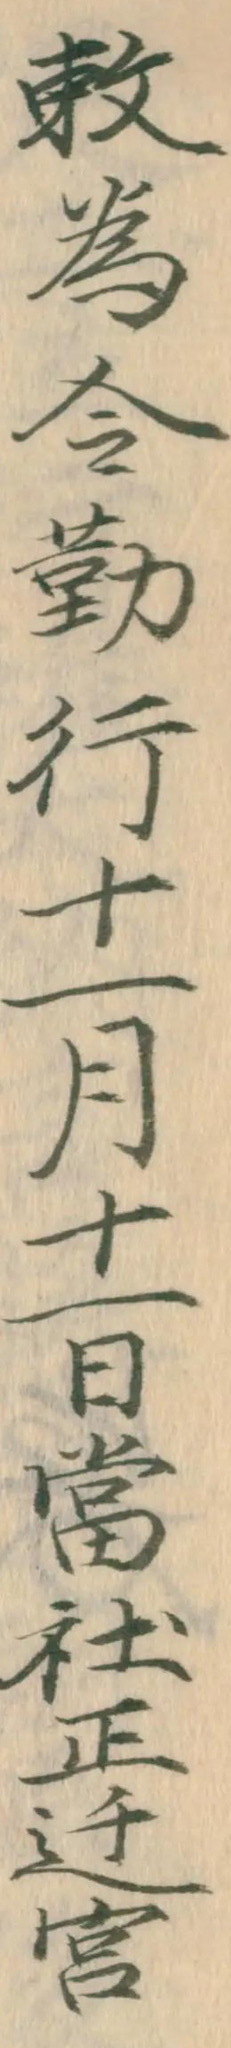敕為令勤行十一月十一日当社正迁宮
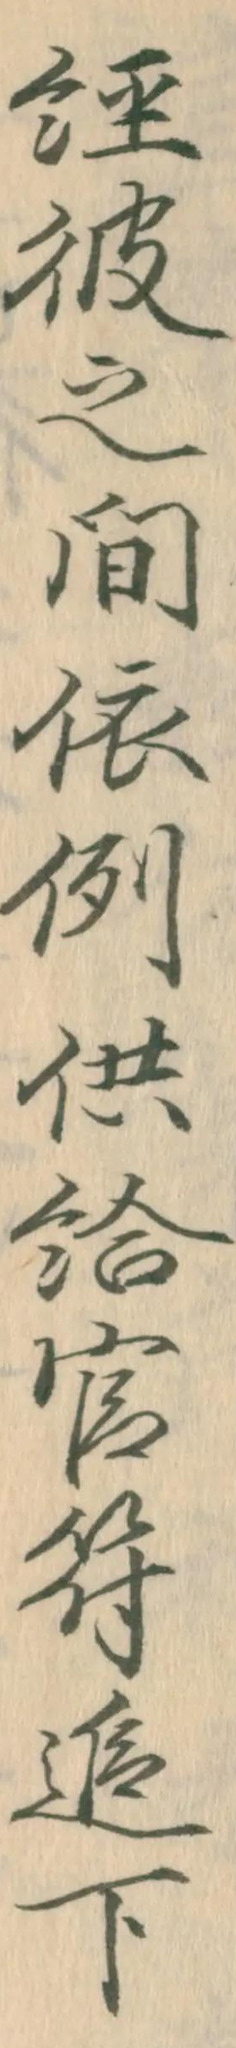経彼之間依例供給官符追下
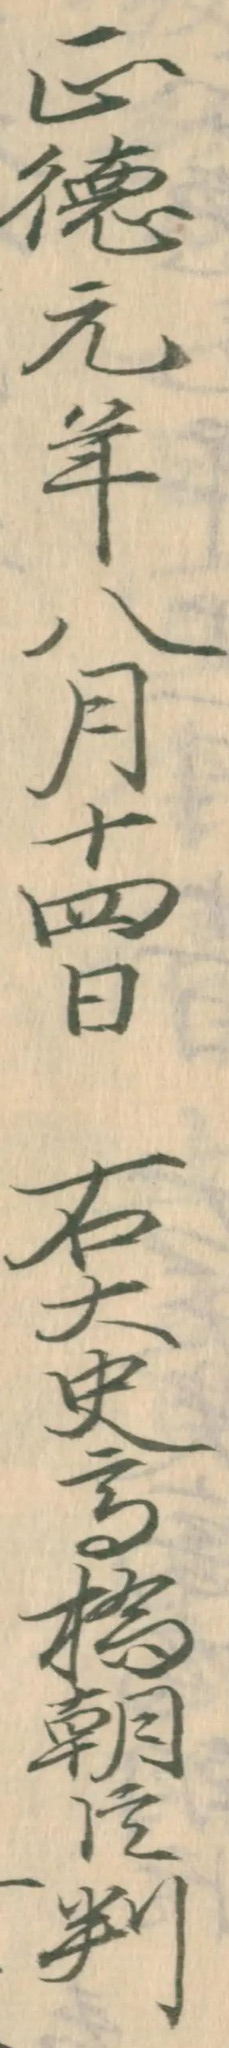正徳元年八月十四日右大史高橋朝臣判奉
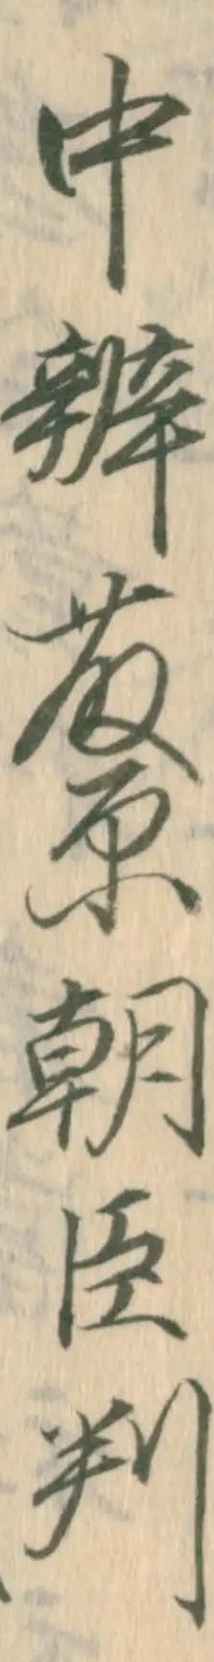中弁藤原朝臣判

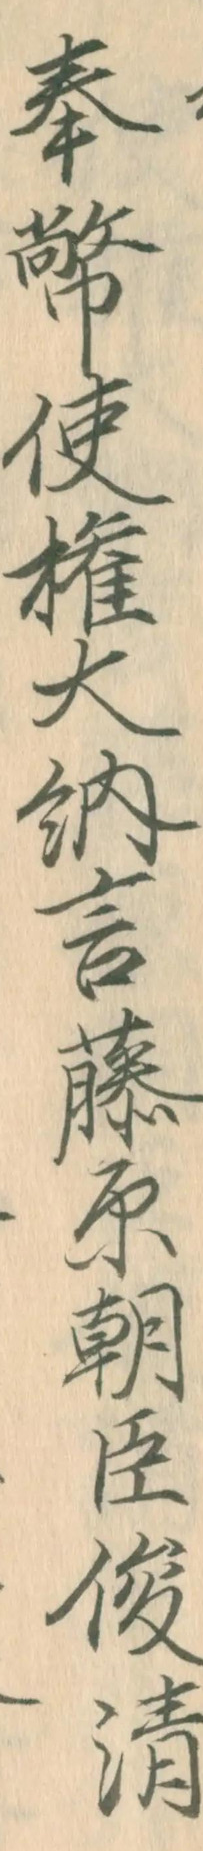奉幣使権大納言藤原朝臣俊清
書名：賀茂社記録. 第16冊
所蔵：国立国会図書館 National Diet Library, JAPAN
